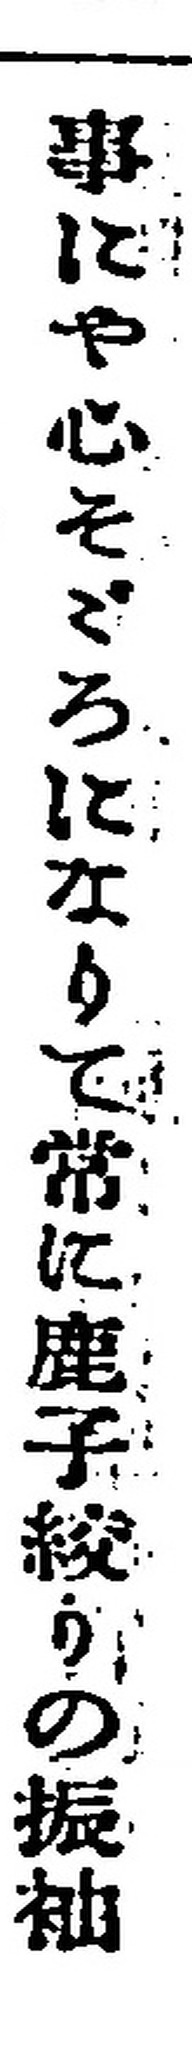事にや心そゞろになりて常に鹿子絞りの振袖
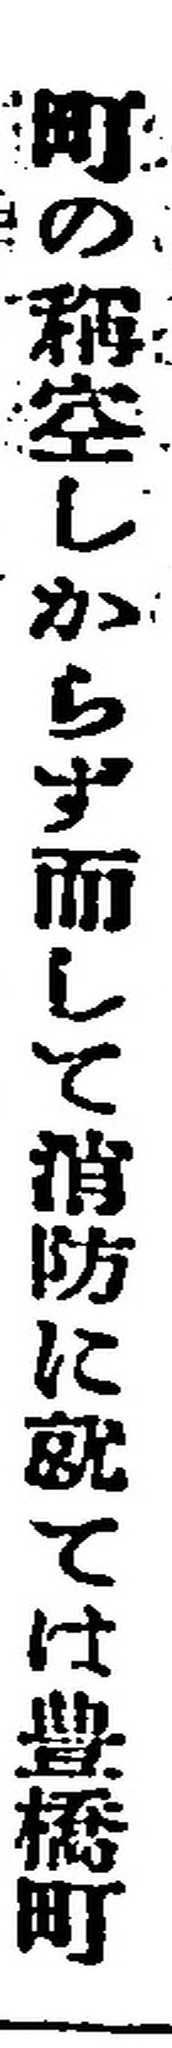町の称空しからず而して消防に於ては豊橋町
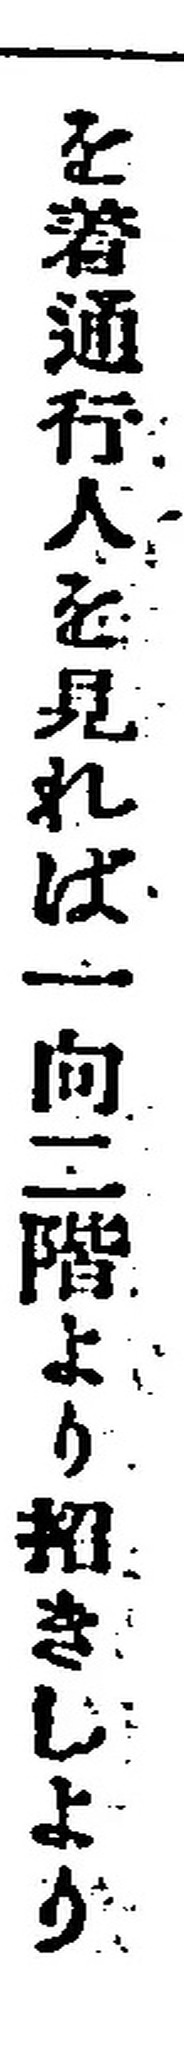を着通行人を見れば一向二階より招きしより
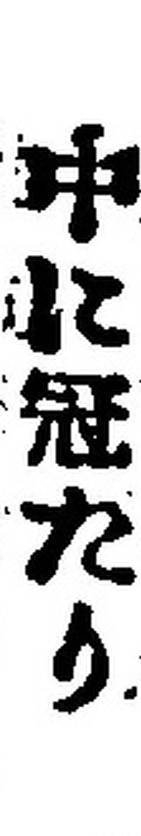中に冠たり
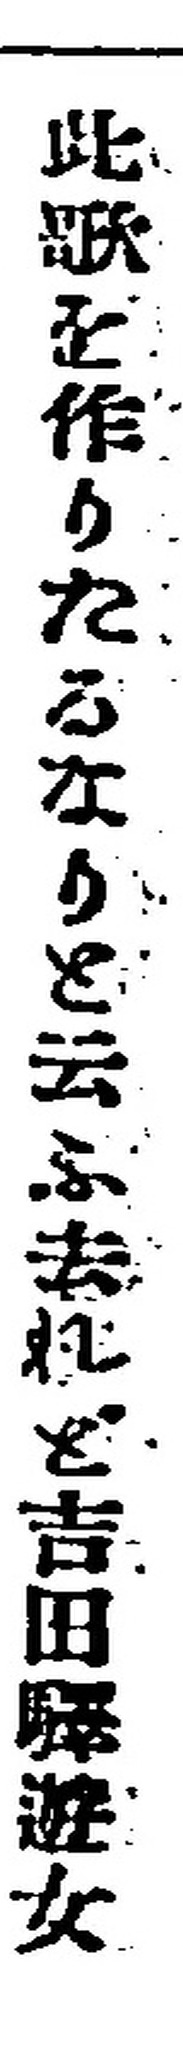此歌を作りたるなりと云ふ去れど吉田駅遊女
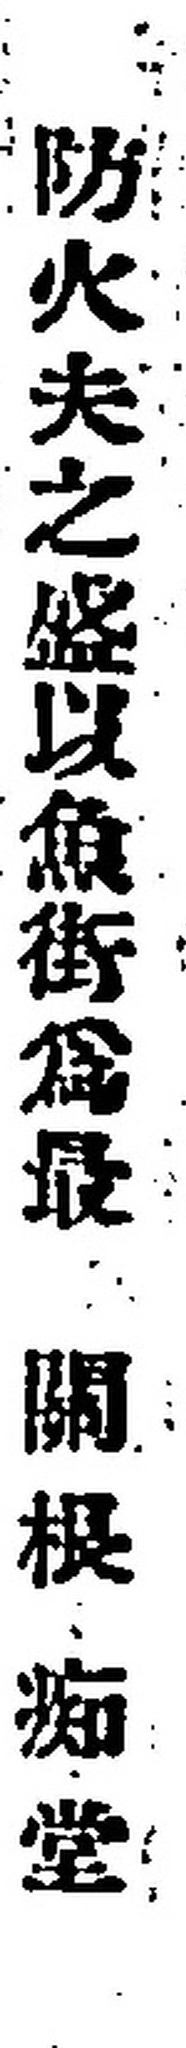防火夫之盛以魚街為最関根痴堂
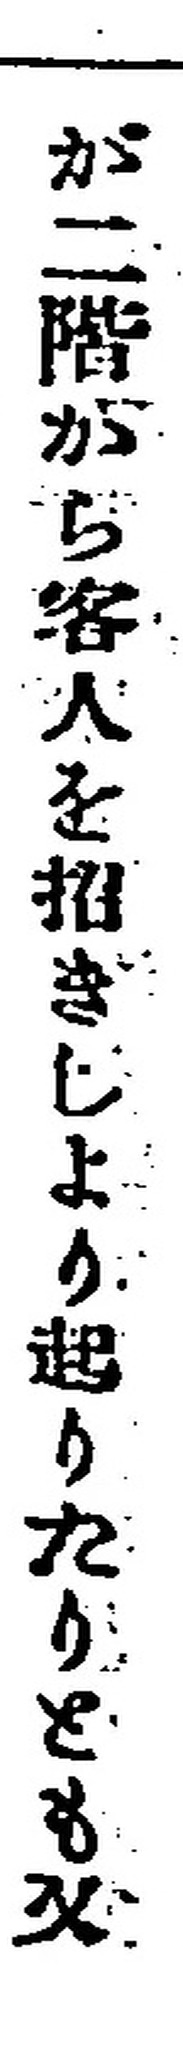が二階から客人を招きしより起りたりとも又
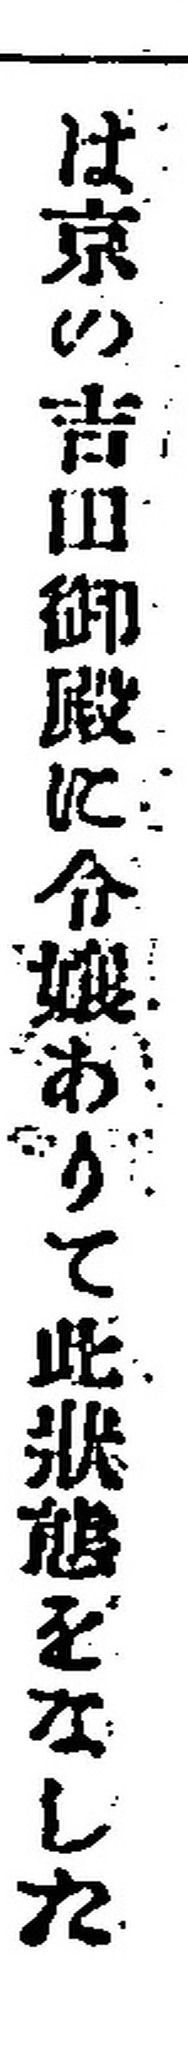は京の吉田御殿に令嬢ありて此状態をなした
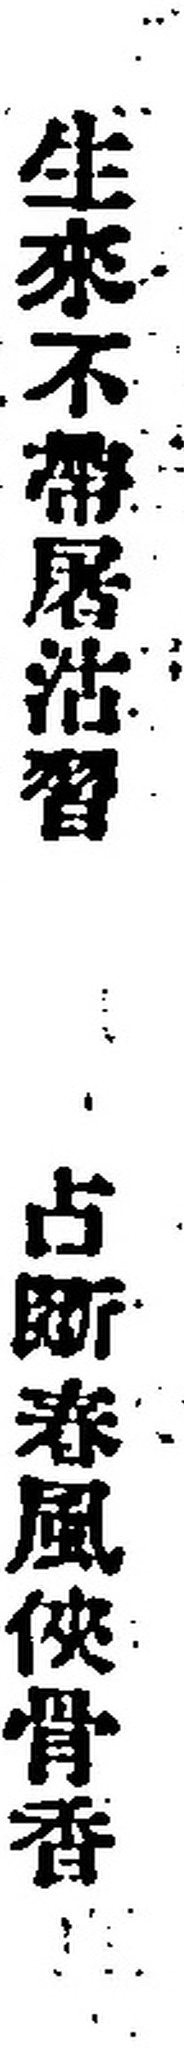生来不帯屠沽習占断春風侠骨香
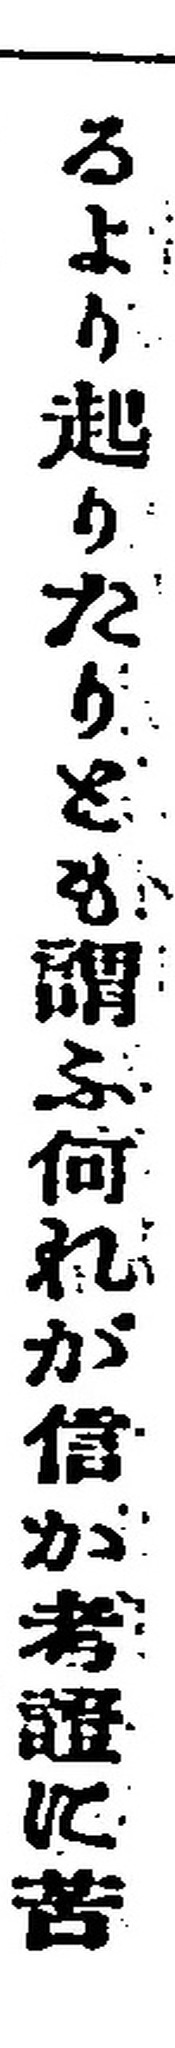るより起りたりとも謂ふ何れが信か考証に苦
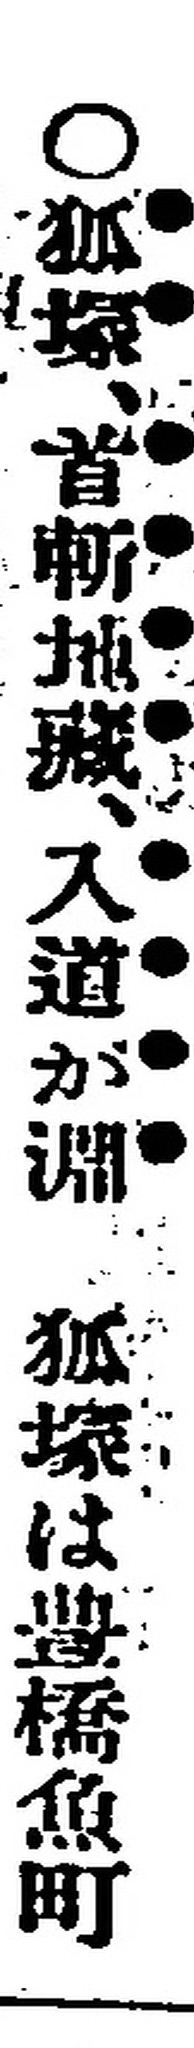○狐塚、首斬地蔵、入道が淵狐塚は豊橋魚町
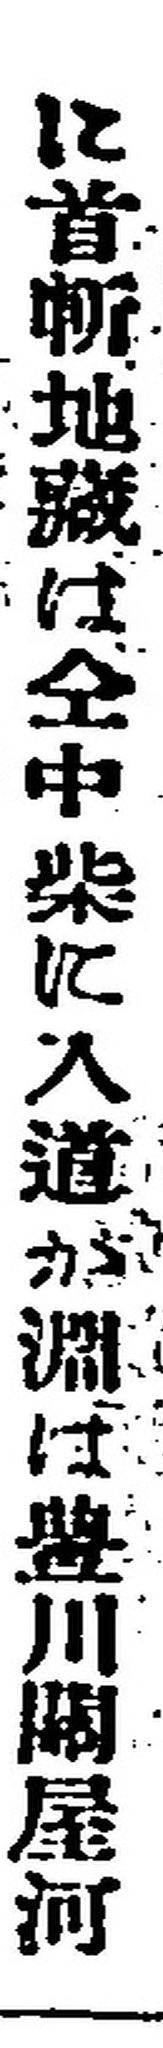に首斬地蔵は仝中柴に入道が淵は豊川関屋河
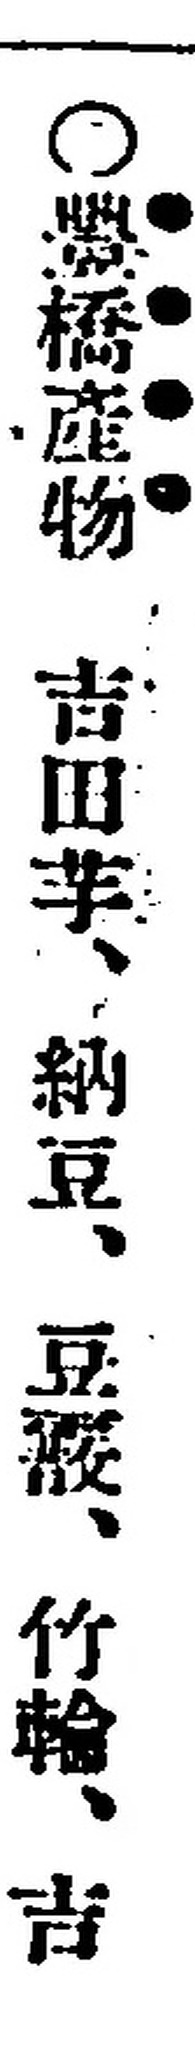○豊橋産物吉田芋、納豆、豆霰、竹輪、吉
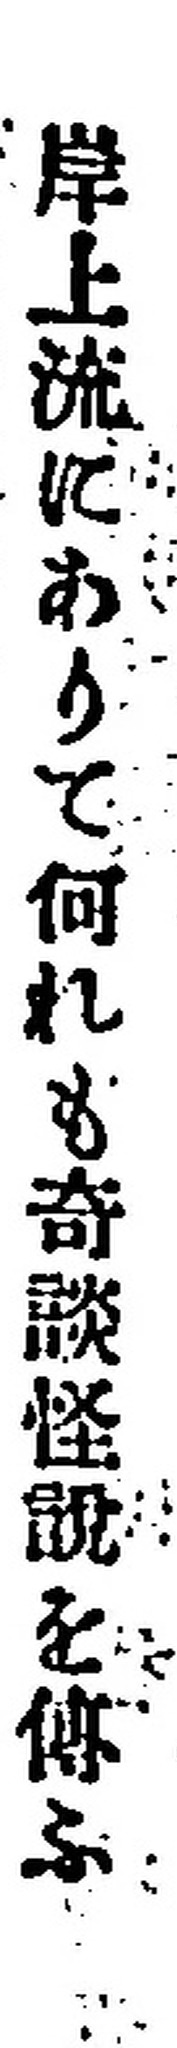岸上流にありて何れも奇談怪説を伝ふ
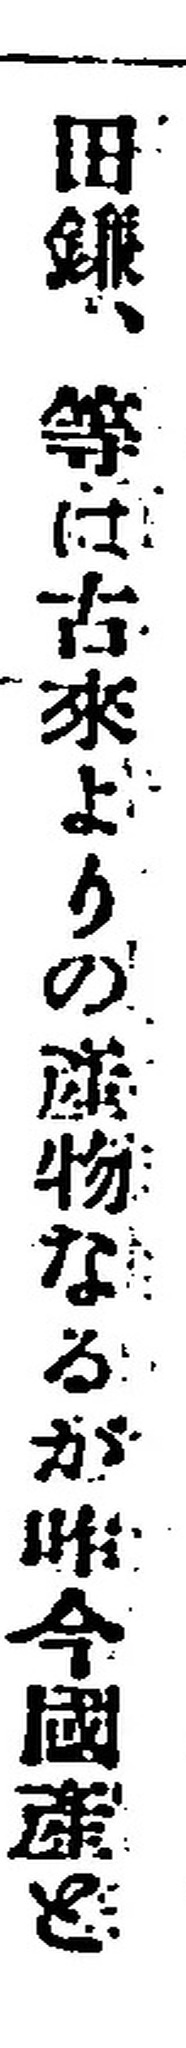田鎌、等は古来よりの産物なるが昨今国産と
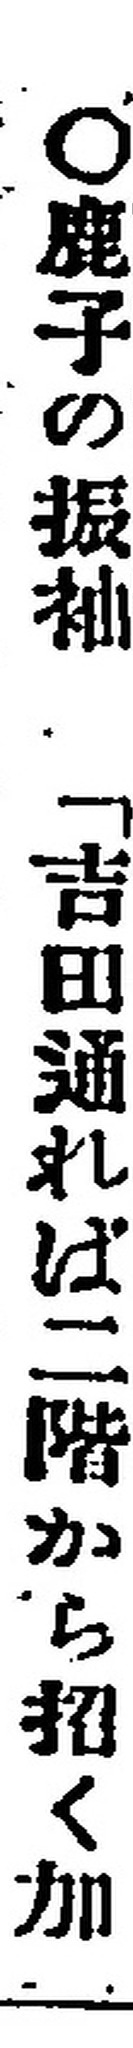○鹿子の振袖「吉田通れば二階から招く加
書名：東参名勝案内
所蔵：国立国会図書館 National Diet Library, JAPAN
